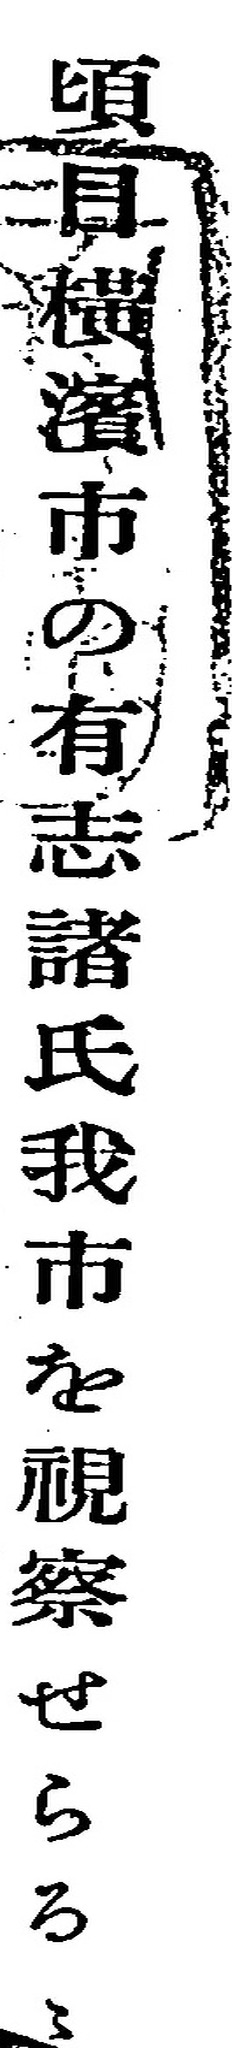頃日横濱市の有志諸氏我市を視察せらるゝの
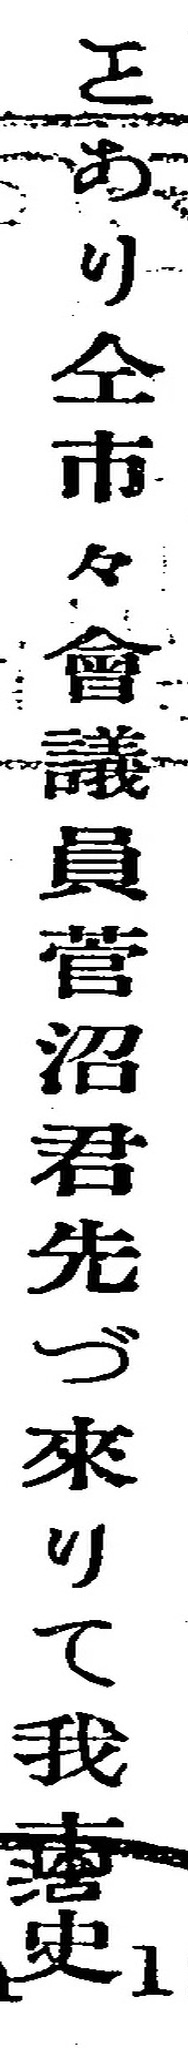ことあり仝市々會議員菅沼君先づ來りて我市史
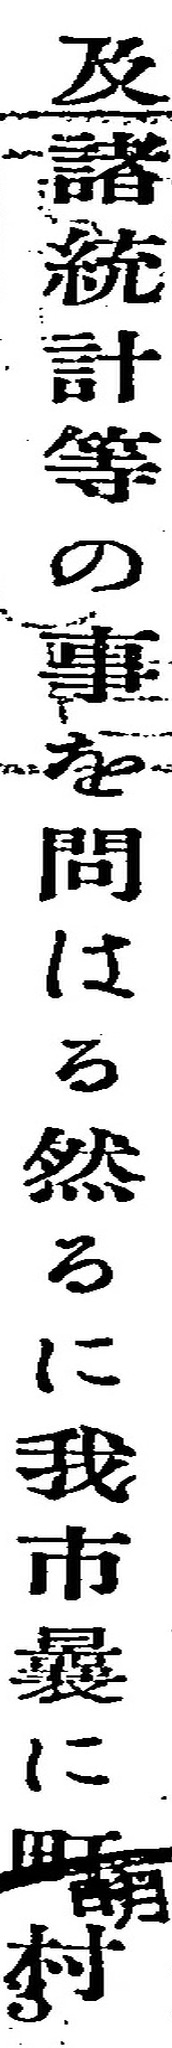及諸統計等の事を問はる然るに我市曩に町村
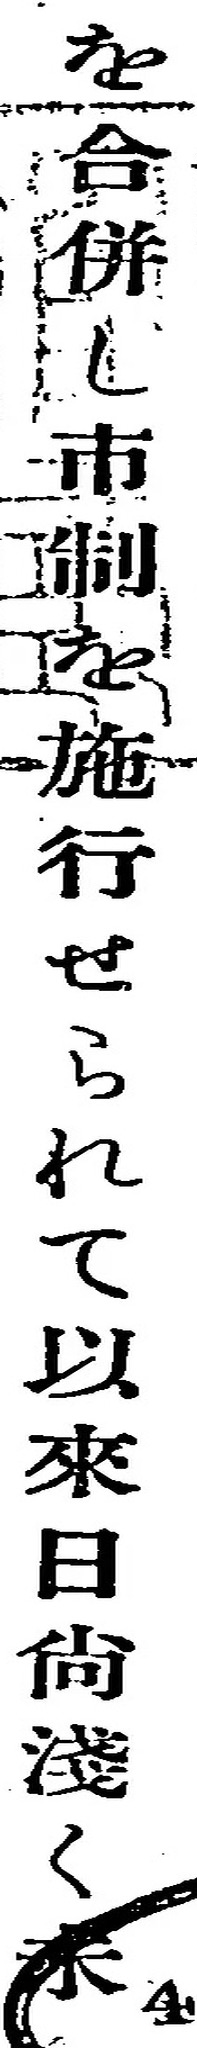を合併し市制を施行せられて以來日尚淺く未
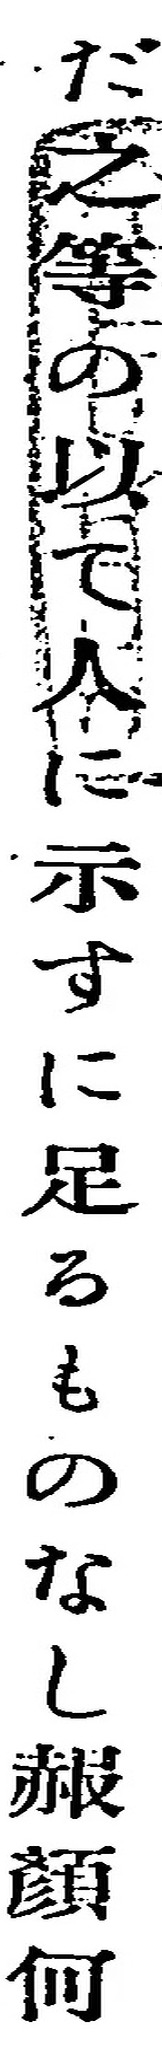だ之等の以て人に示すに足るものなし赧顏何
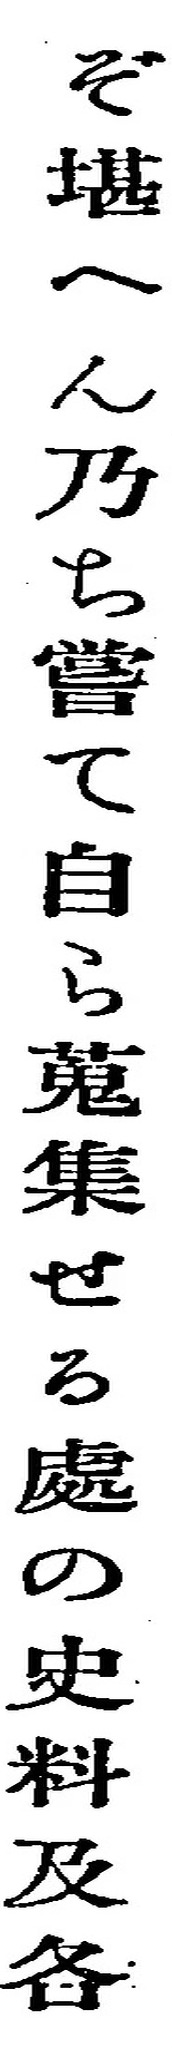ぞ堪へん乃ち嘗て自ら蒐集せる處の史料及各
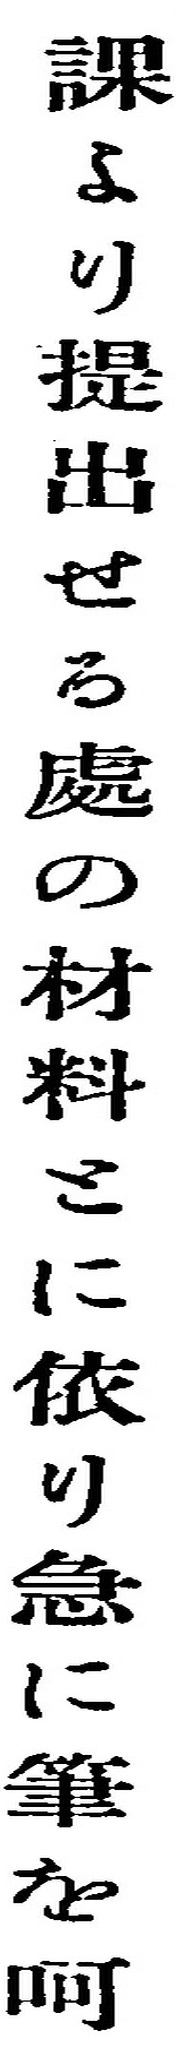課より提出せる處の材料とに依り急に筆を呵
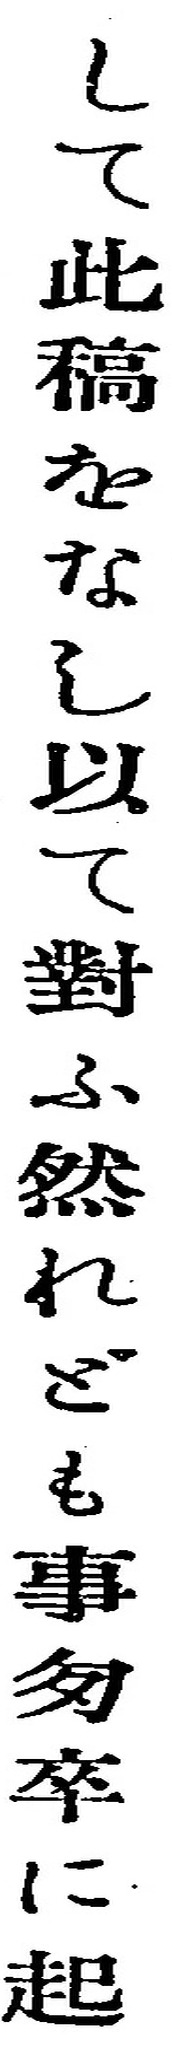して此稿をなし以て對ふ然れども事匇卒に起
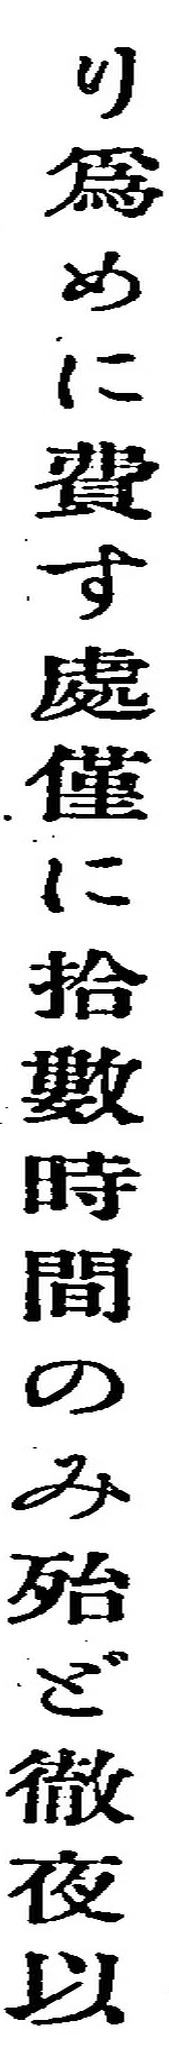り爲めに費す處僅に拾數時間のみ殆ど徹夜以

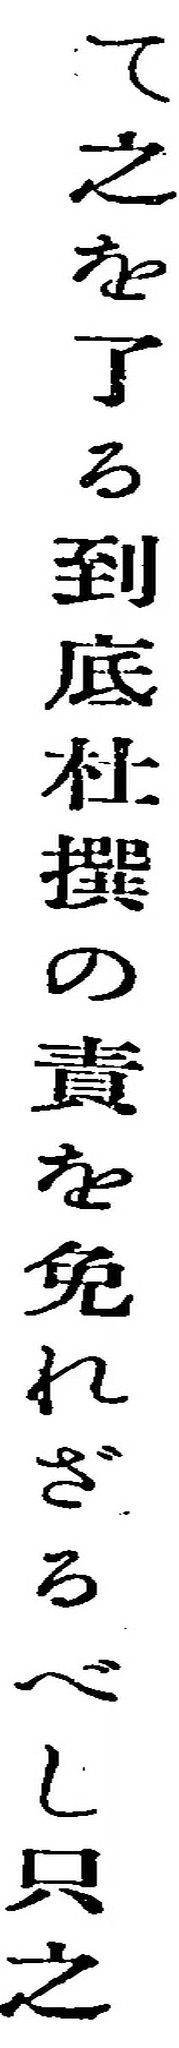て之を了る到底杜撰の責を免れざるべし只之
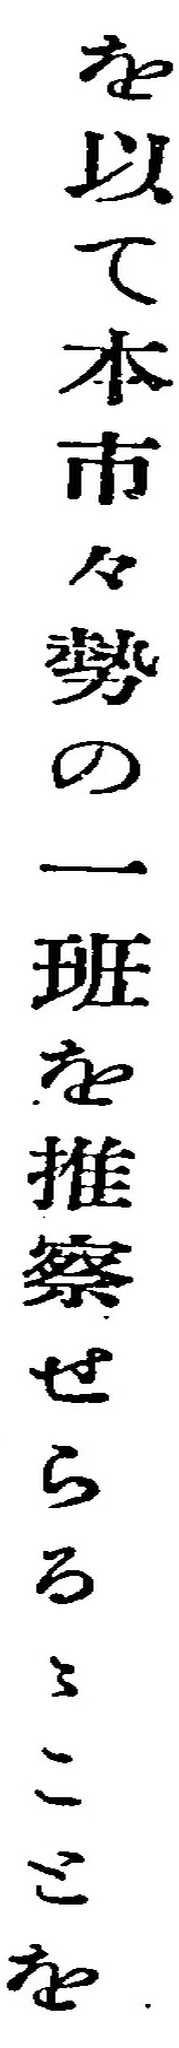を以て本市々勢の一班を推察せらるゝことを
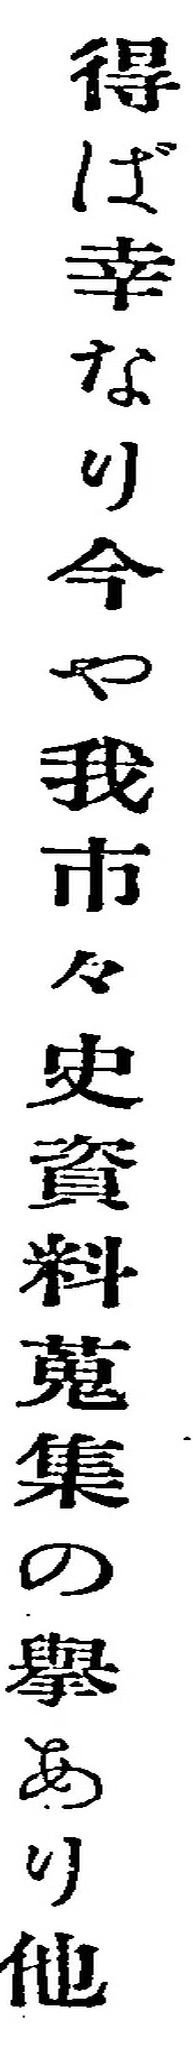得ば幸なり今や我市々史資料蒐集の擧あり他
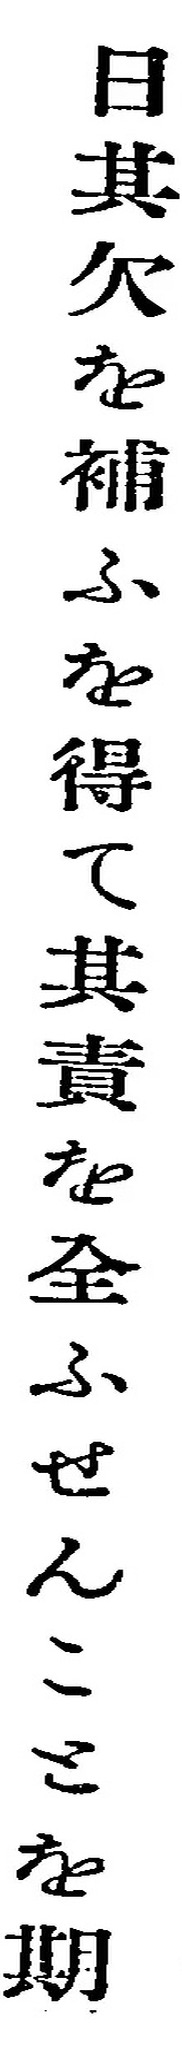日其欠を補ふを得て其責を全ふせんことを期
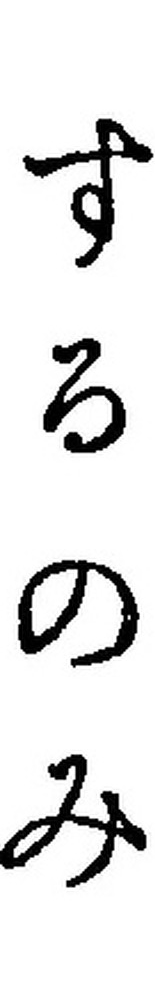するのみ
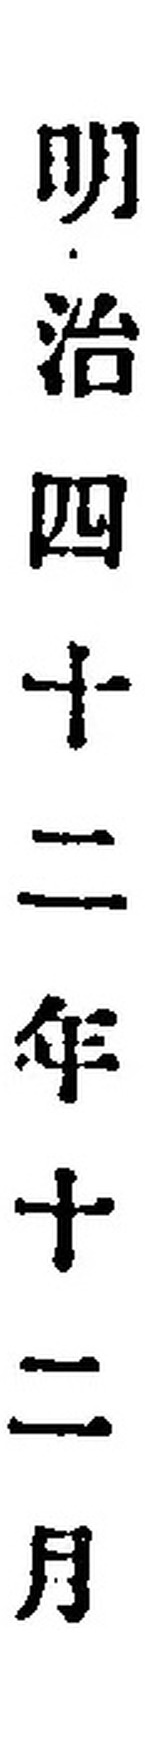明治四十二年十二月
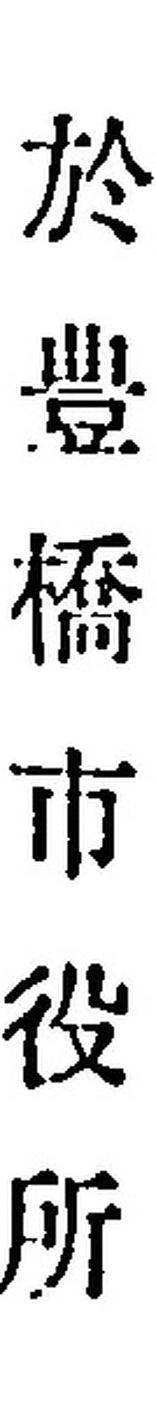於豊橋市役所
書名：豊橋志要
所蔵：国立国会図書館 National Diet Library, JAPAN
